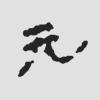亓（其）
